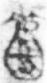○（韔）
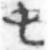屯
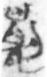○（貂）
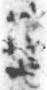○（貘）
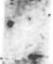之
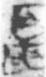聶（攝）
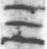三
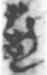○（貂）
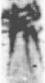與
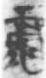彔（綠）
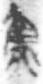魚
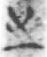之
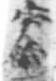○（箙）
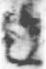狐
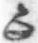白
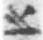之
